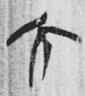大（太）
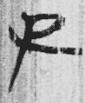子
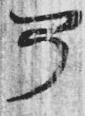乃
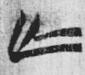亡
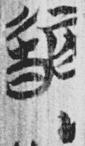○（聞）
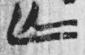亡
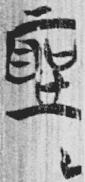聖（聽）
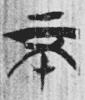不
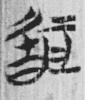○（聞）
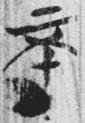不
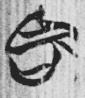命（令）
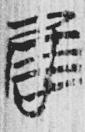唯
